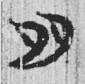多
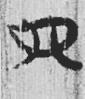四
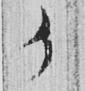人
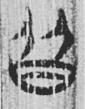皆
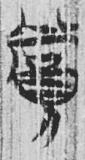賞
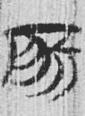所
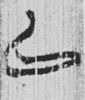㠯
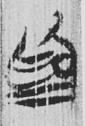爲
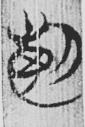{叀刀}（斷）
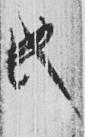女（如）
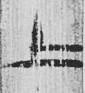上
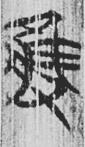○（獲）
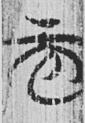而
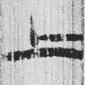上
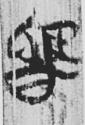○（聞）
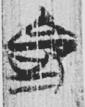命
